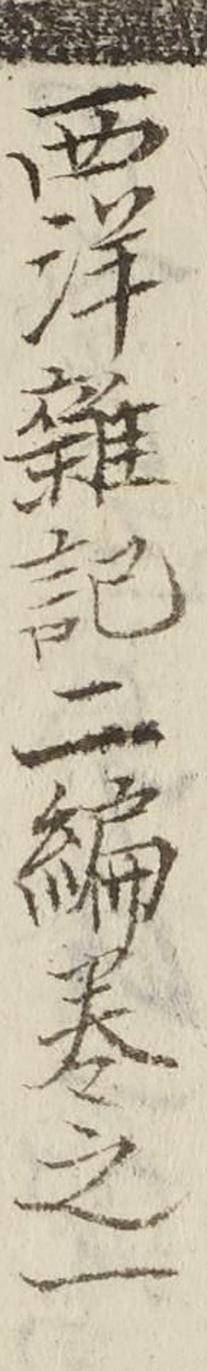西洋雑記二編巻之一
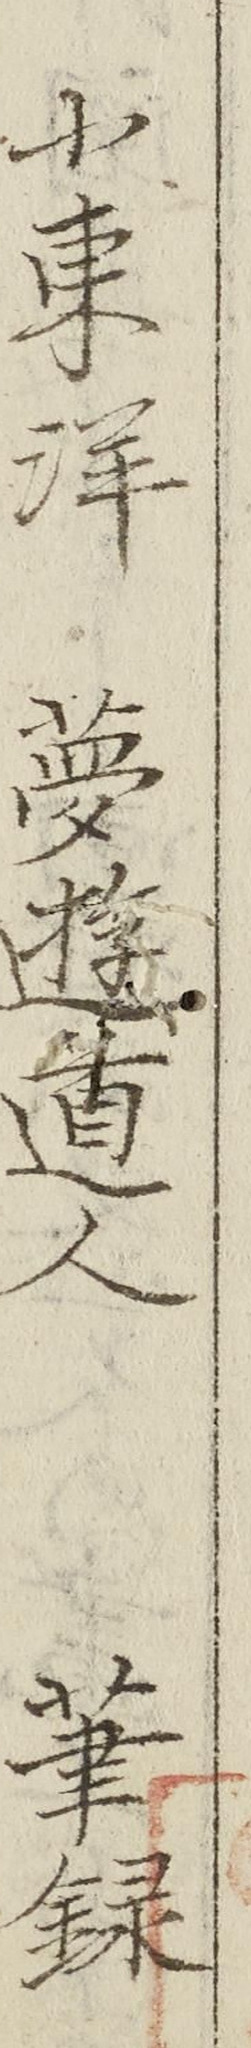小東洋夢游道人筆録
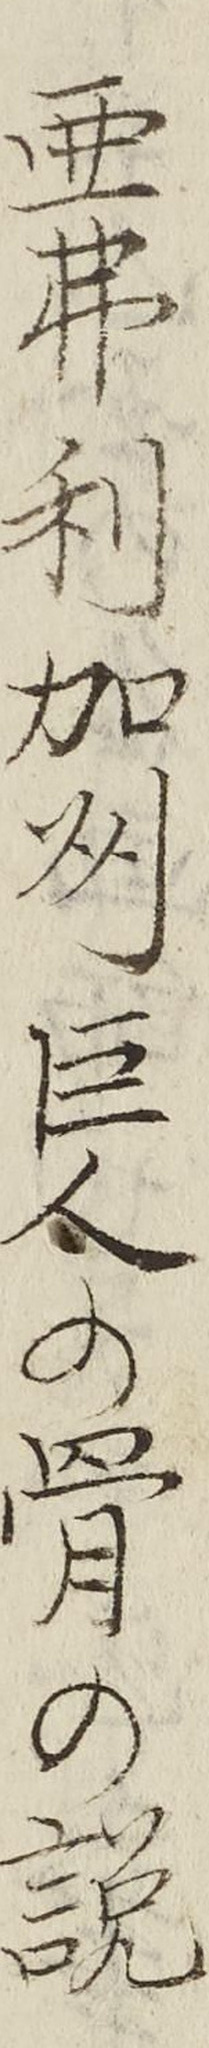亜弗利加州巨人の骨の説
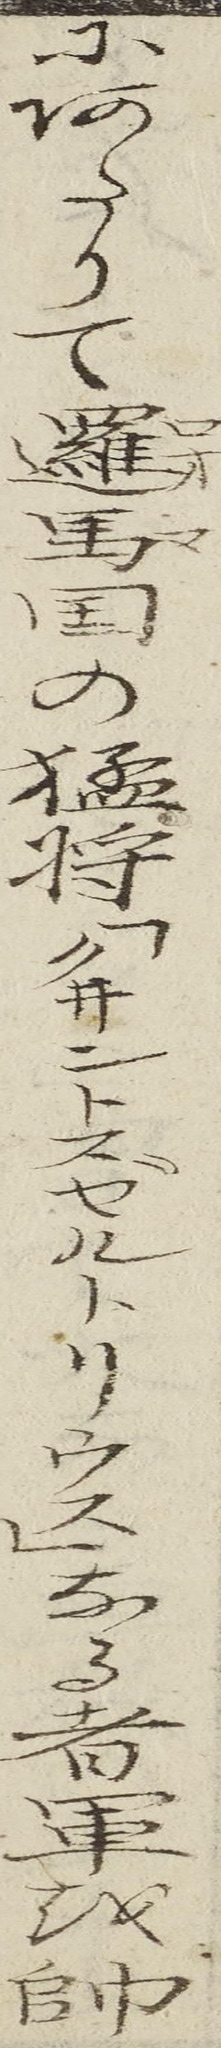にあたりて羅馬国の猛将「クヰントスセルトリウス」なる者軍を師
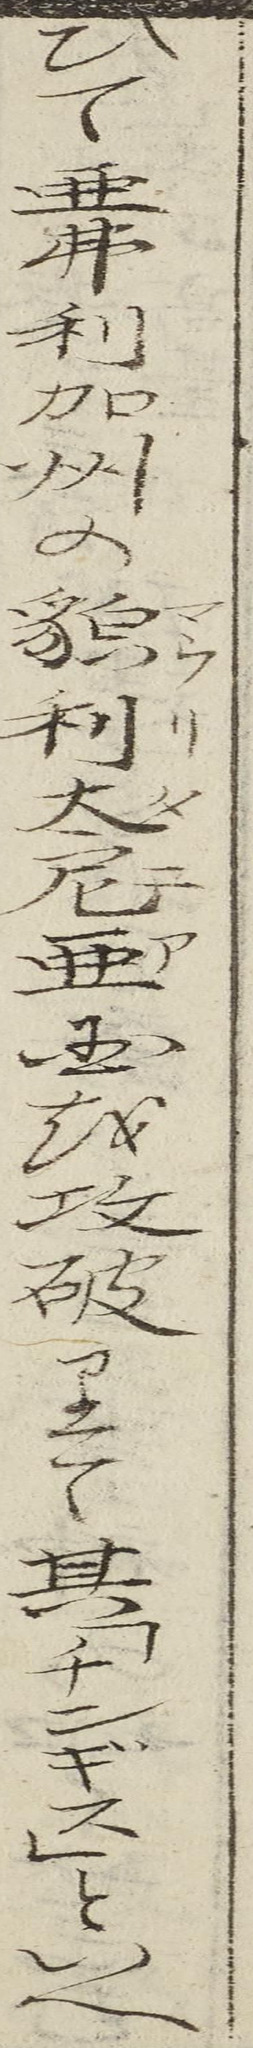ひて亜弗利加州の貌利太尼亜国を攻破りて其「チンギス」といへ
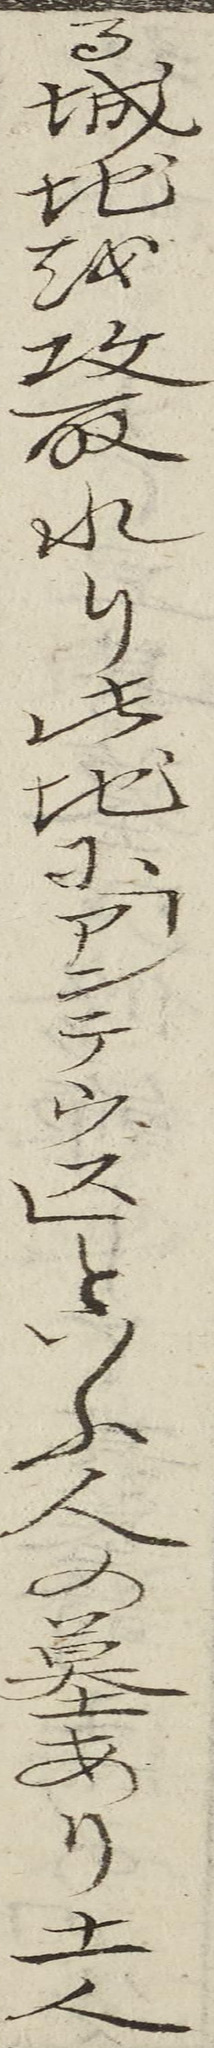る城地を攻取れり此地に「アンテウス」といふ人の墓あり土人
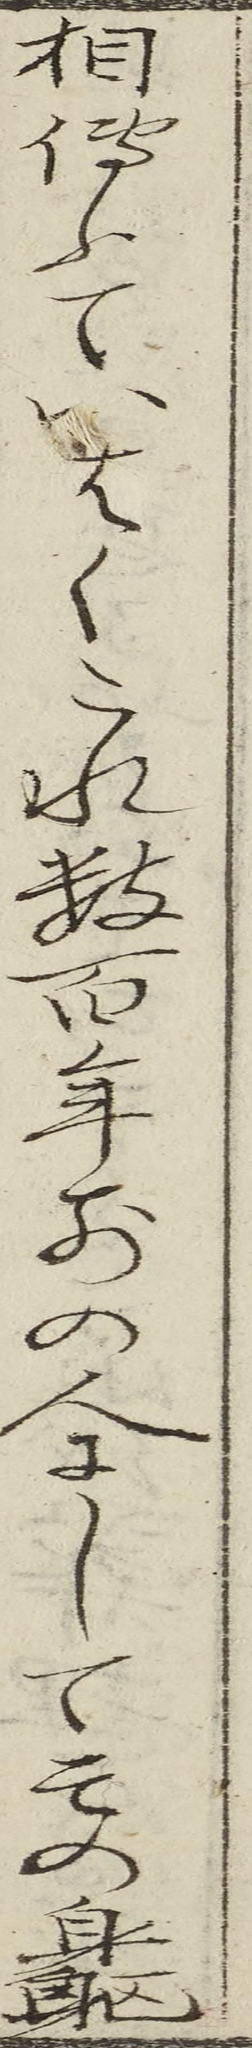相伝ふていはくこれ数百年前の人にしてその身躯
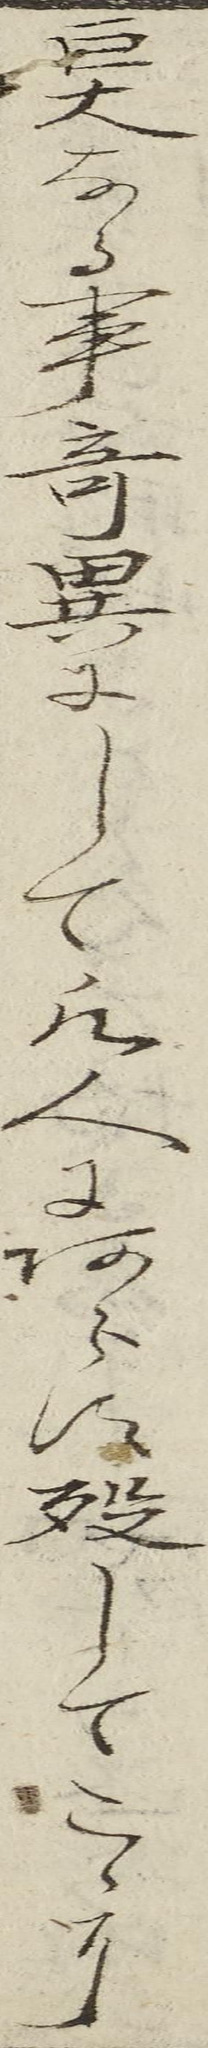巨大なる事奇異にして凡人にあらす歿してこゝに
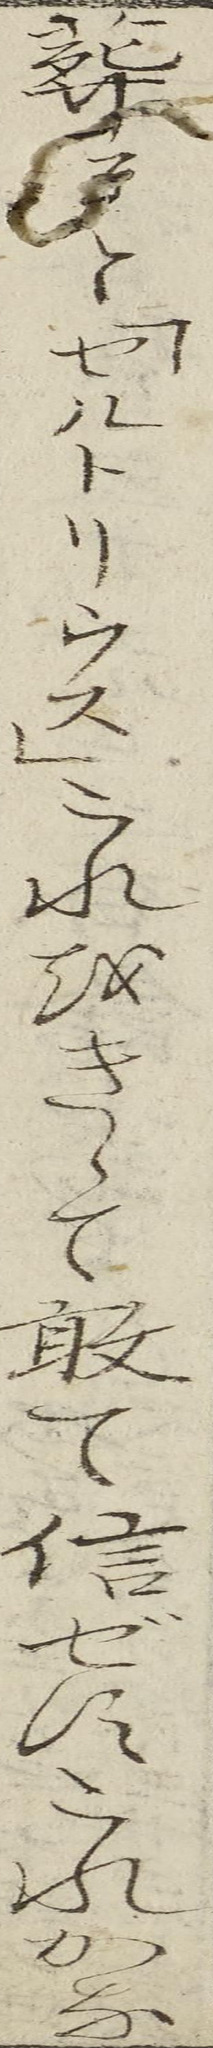葬そと「セルトリウス」これをきゝて敢て信ぜすこれかな
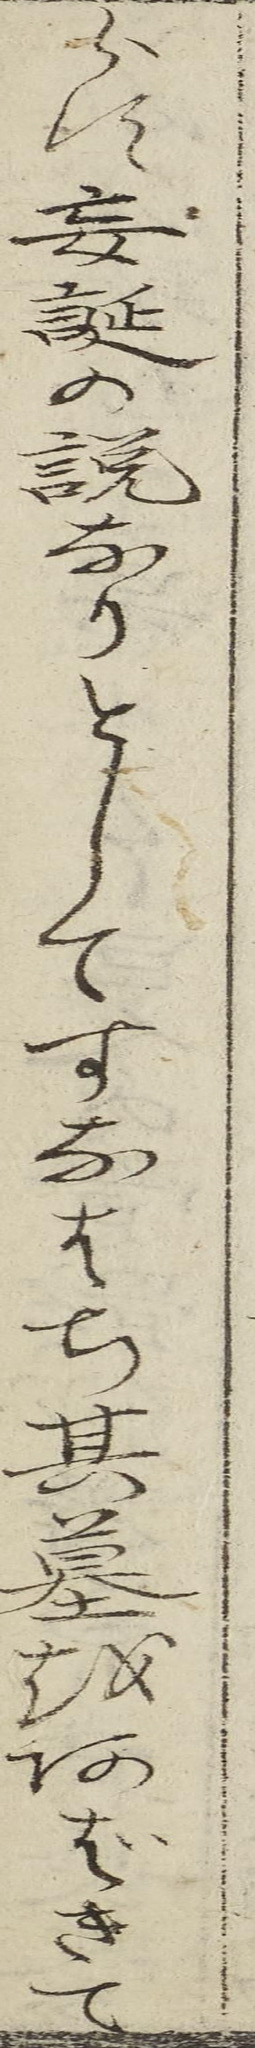らす妄誕の説なりとしてすなはち其墓をあばきて

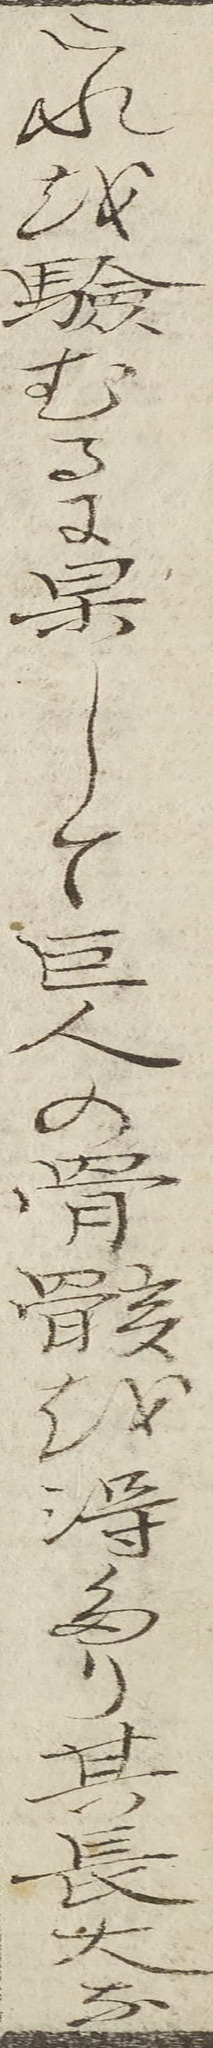これを験むるに果して巨人の骨骸を得たり其長大な
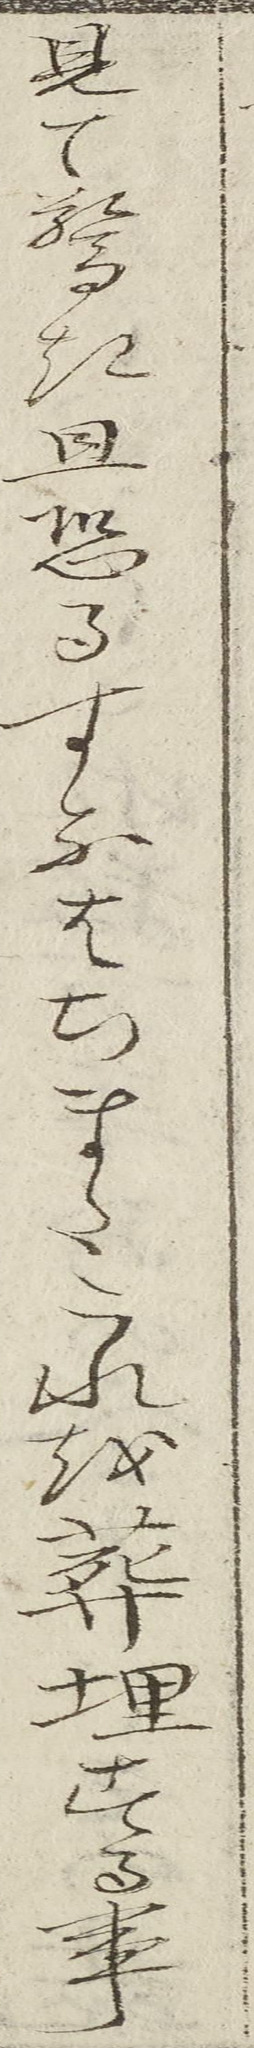見て驚き且恐るすなはちまたこれを葬埋する事
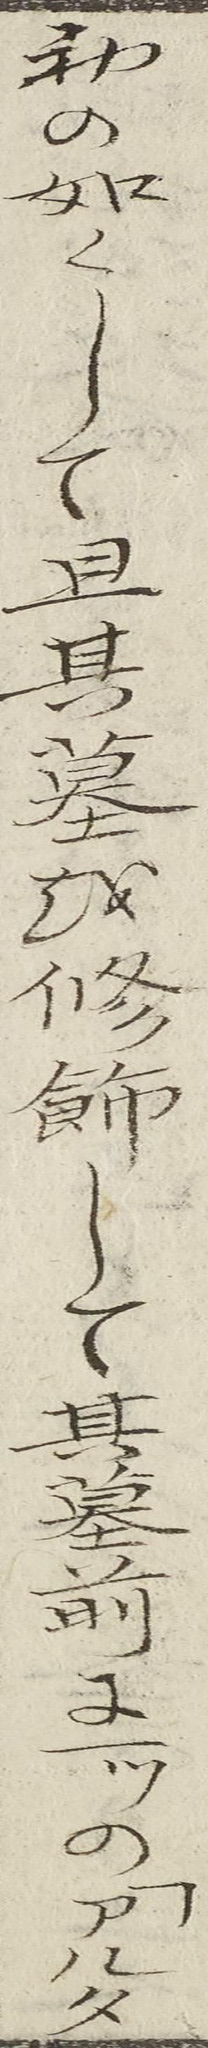初の如くして且其墓を修飾して其墓前に一ツの「アルタ
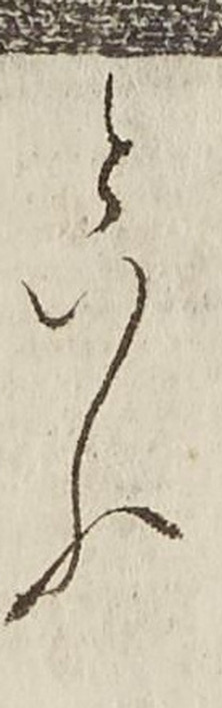といふ
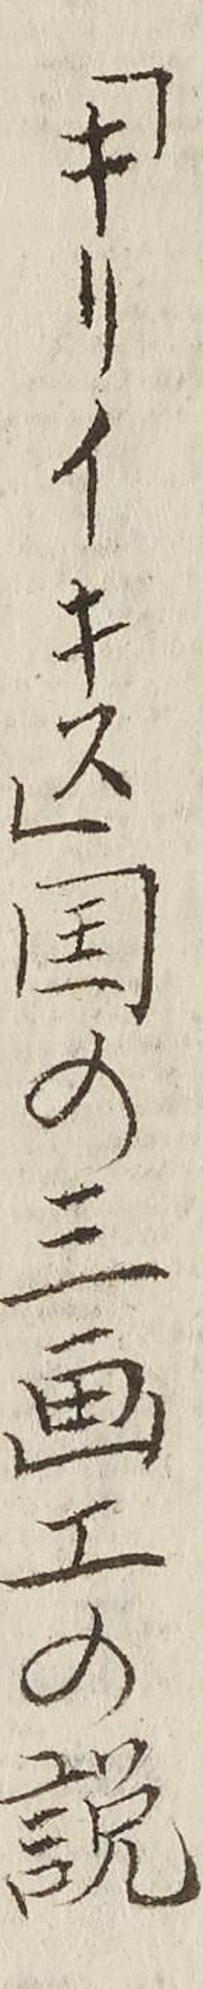「キリイキス」国の三画工の説
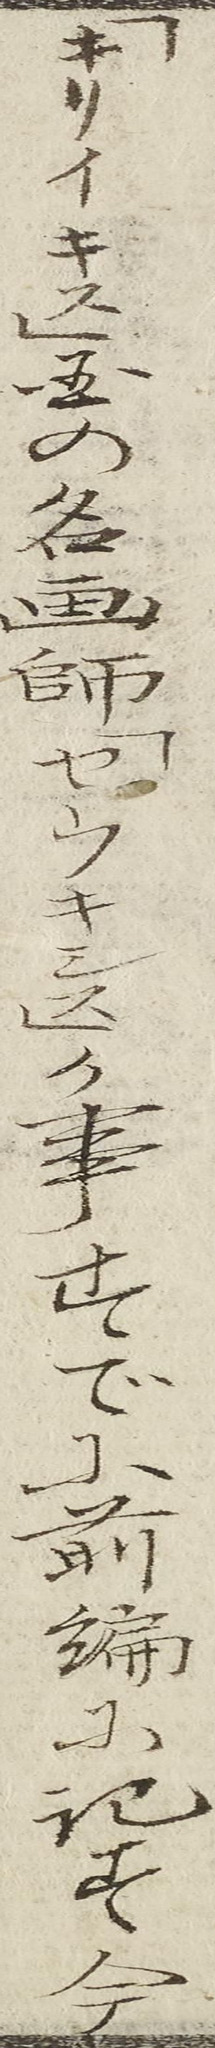「キリイキス」国の名画師「セウキシス」の事すでに前編に記す今
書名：西洋雜記　乾
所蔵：東京大学地震研究所図書室 Earthquake Research Institute Library, The University of Tokyo, JAPAN
